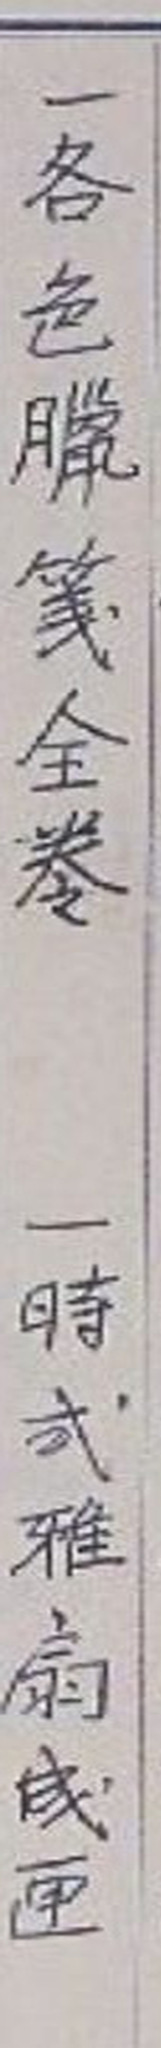一各色臘箋全巻一時式雅扇成匣
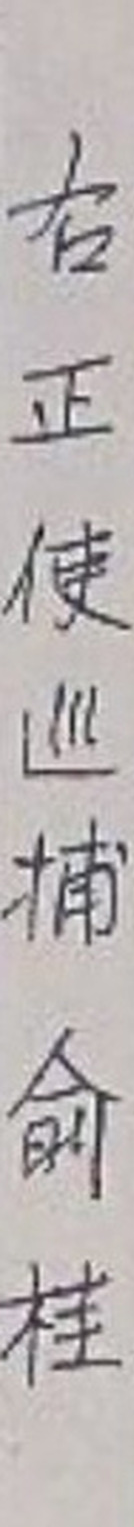右正使巡捕兪桂
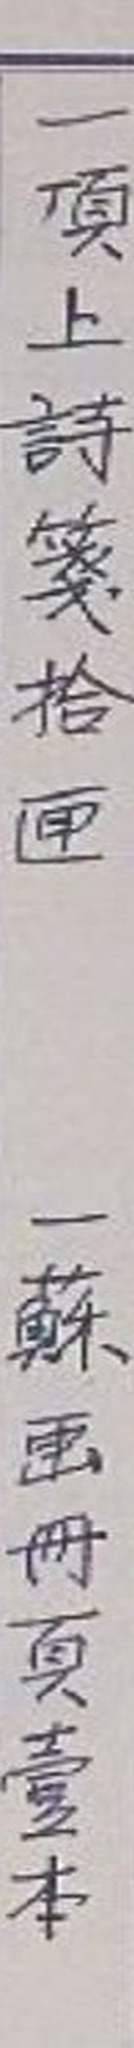一頂上詩箋拾匣一蘇画冊頁壱本
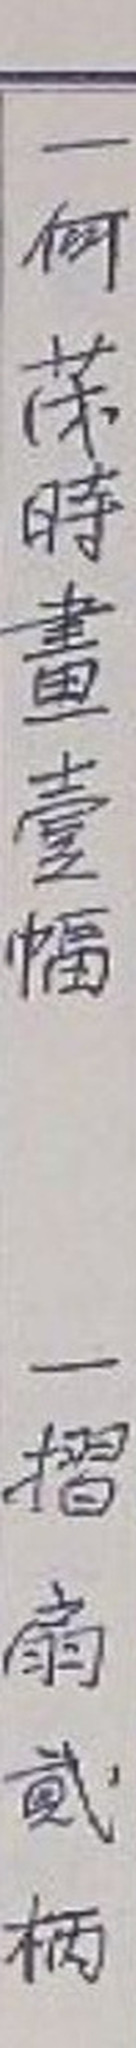一何茂時画壱幅一摺扇弐柄
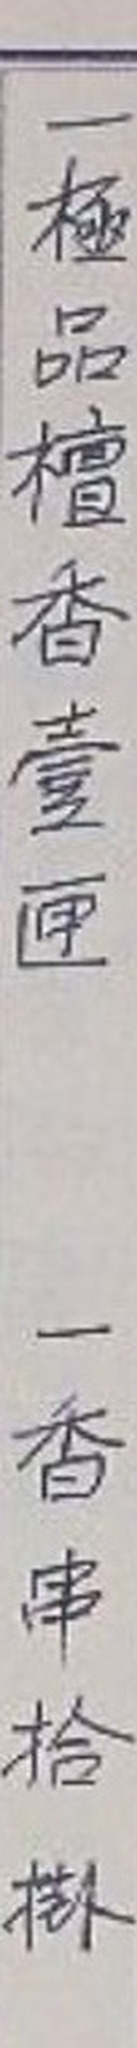一極品檀香壱匣一香串拾掛
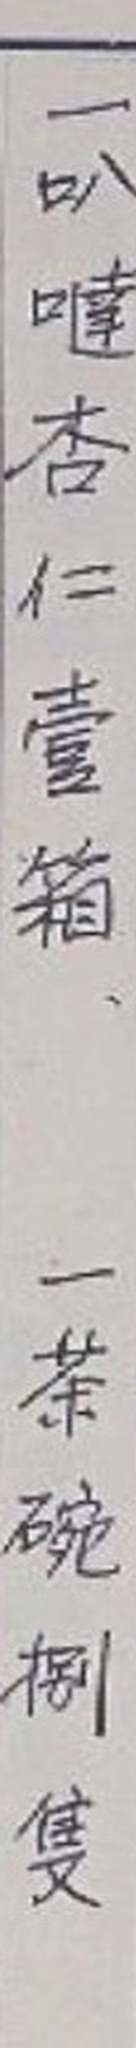一叭噠杏仁壱匣一茶碗捌隻
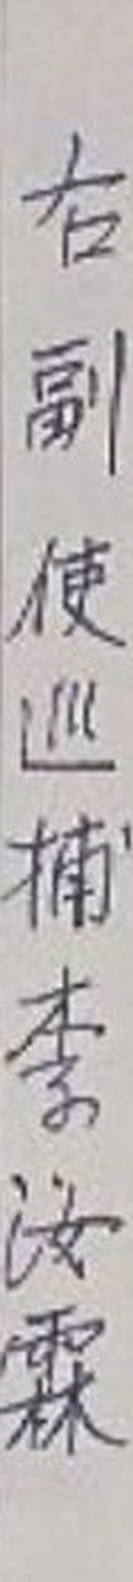右副使巡捕李汝霖
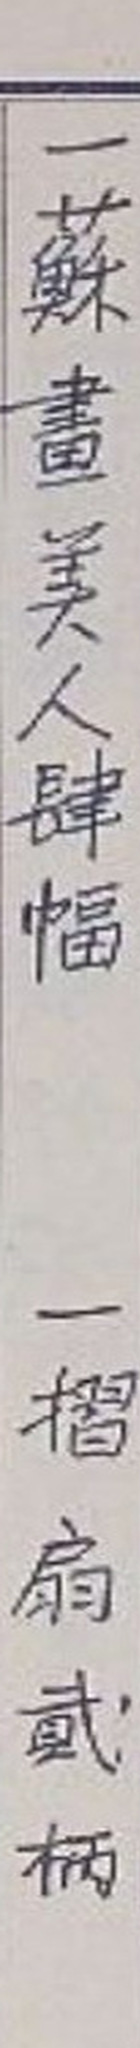一蘇画美人肆幅一摺扇弐柄
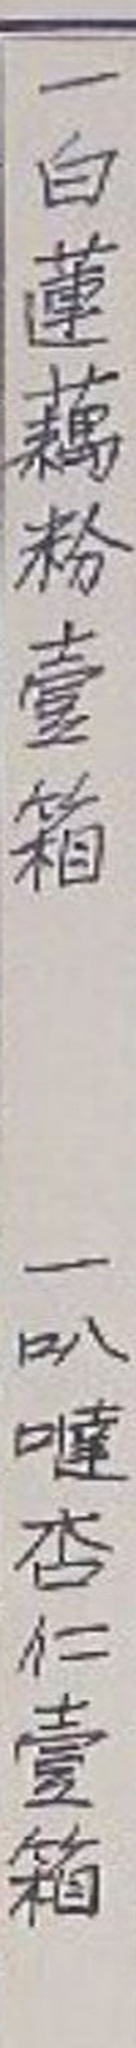一白蓮藕粉壱箱一叭噠杏仁壱箱
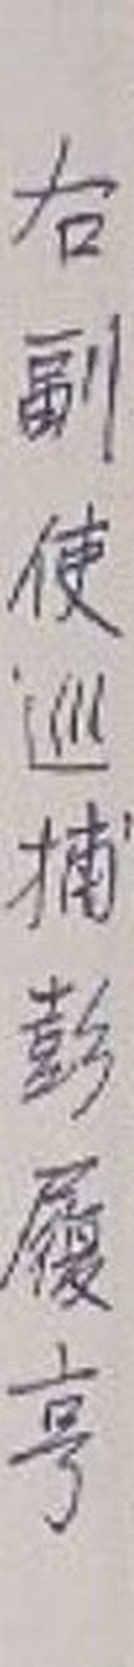右副使巡捕彭履亨
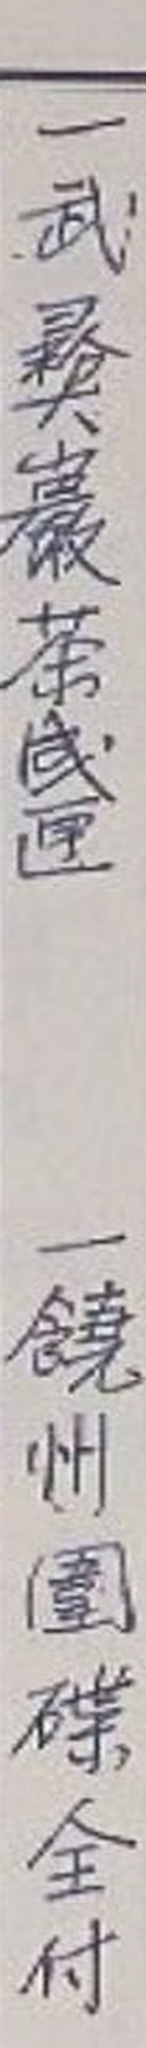一武彛巖茶弐匣一饒州囲碟全付
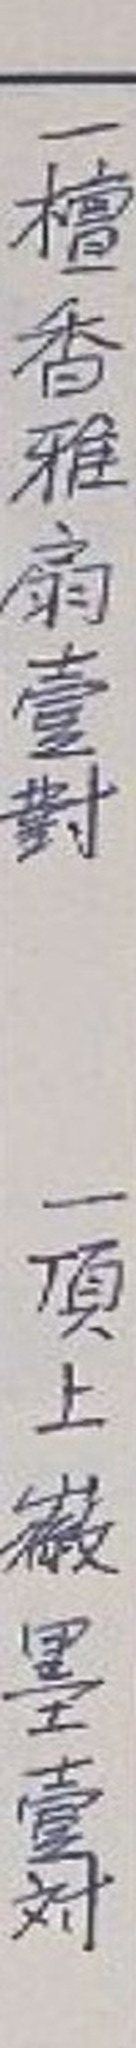一檀香雅扇壱対一頂上𡽪墨壱対
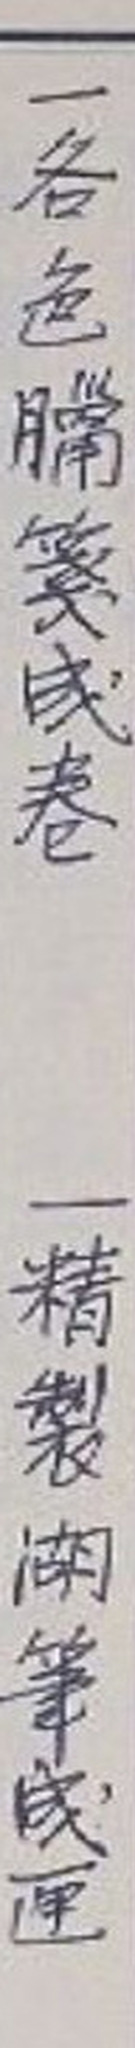一各色臘箋成巻一精製湖筆成匣
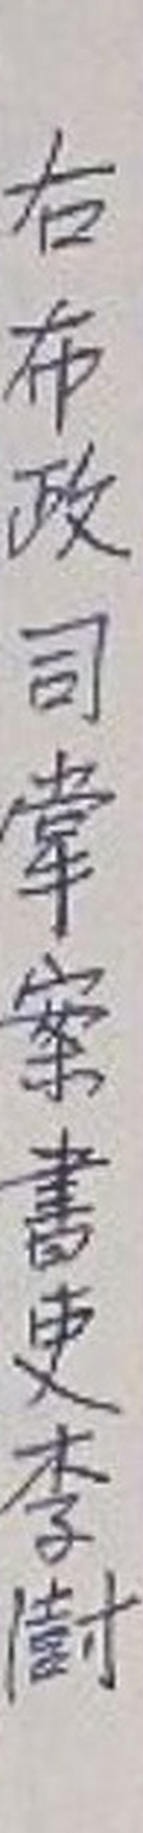右布政司掌案書吏李澍
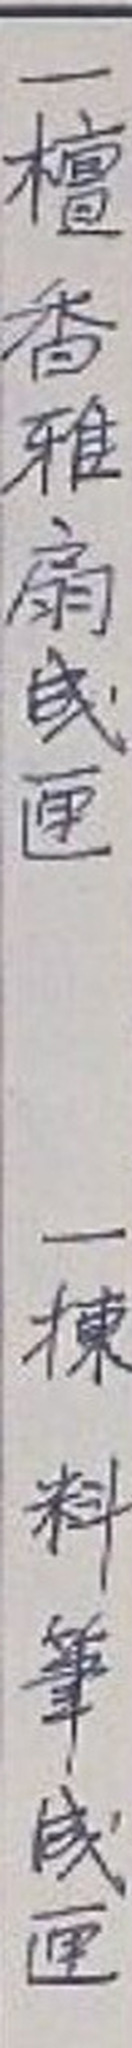一檀香雅扇成匣一揀料筆成匣
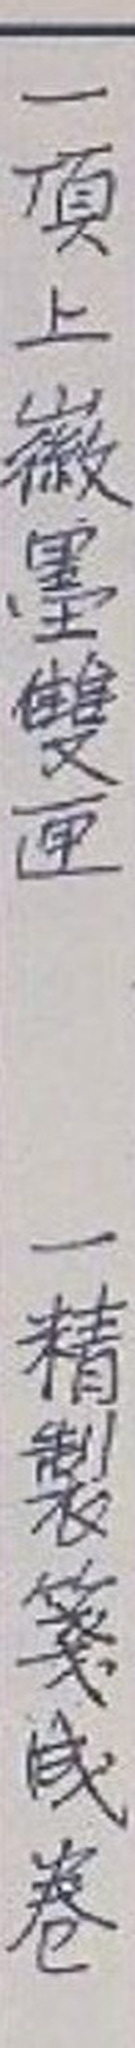一頂上𡽪墨雙匣一精製箋弐巻
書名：支那冊封使来琉諸記 下巻
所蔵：University of the Ryukyus Library
